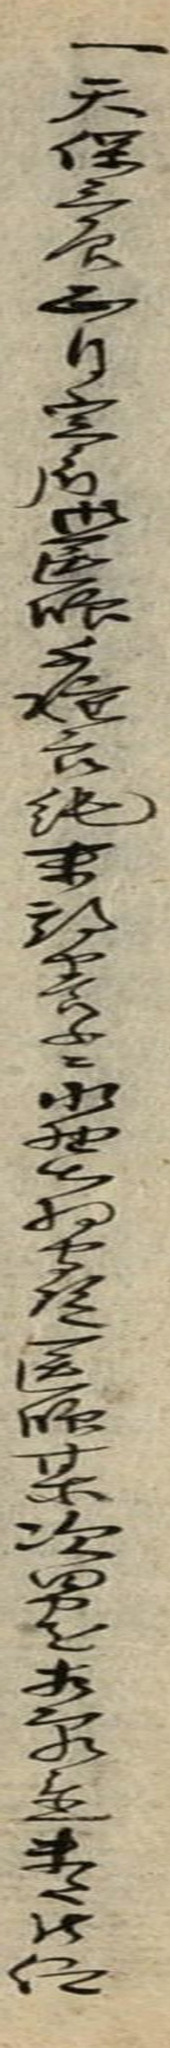一天保三辰正月定府御医師千種良純末期養子ニ水野出羽守殿医師某次男を相願置末た被仰
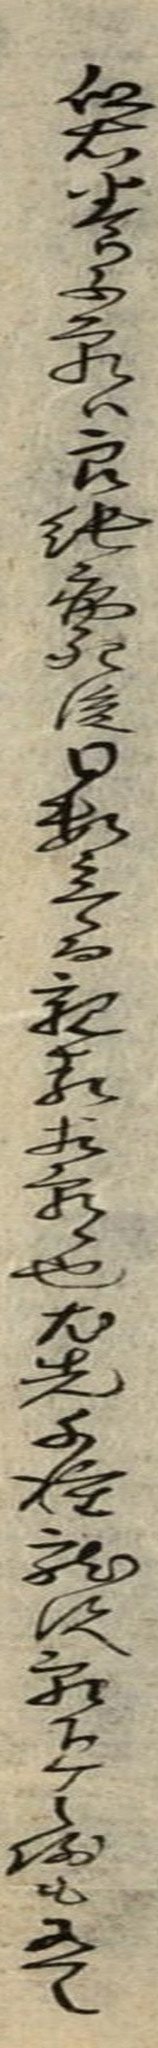但右養子願ハ良純病死後日数立候而親類相願候也尤先千種龍沢願下ケ候儀も有之
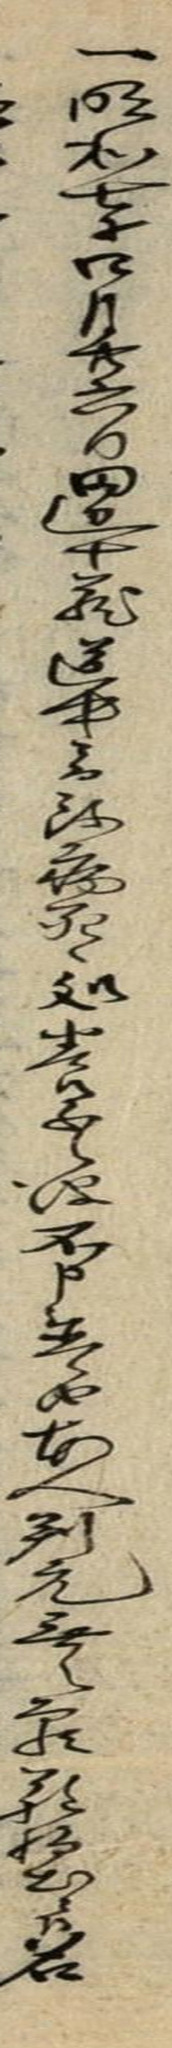一明和七寅四月廿六日田辺十蔵道中ニ而致病死候処養子之儀不申置候由本人判元無之願難指出ニ付名
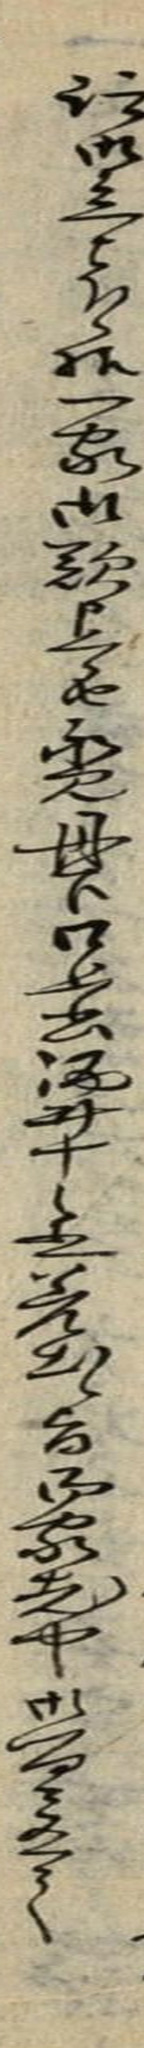跡御立被下候様一家御歎申上候由永見丹下口上書酒井十之丞差出候旨御家老中御留ニ有之
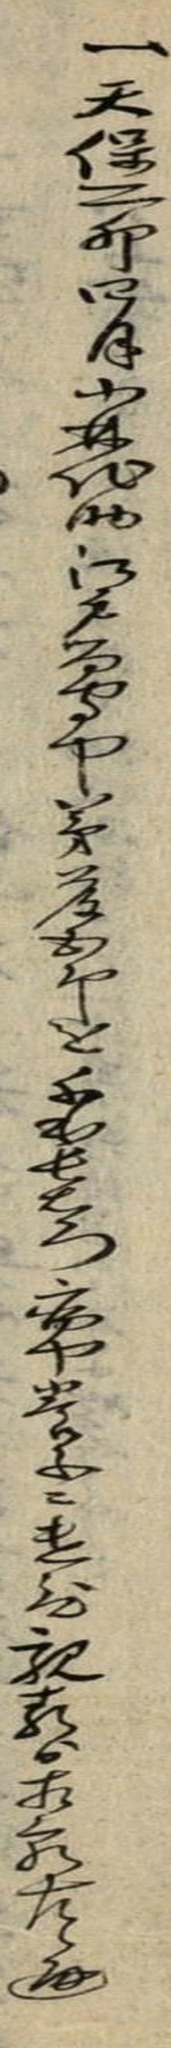一天保ニ卯四月小林作助江戸留守中弟藤五郎を千本長右衛門病中養子ニ遣度親類ゟ相願左之通
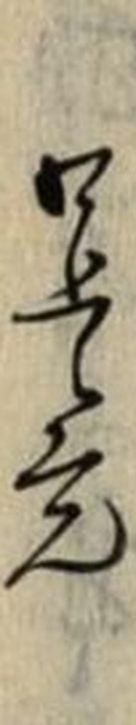口上之覚
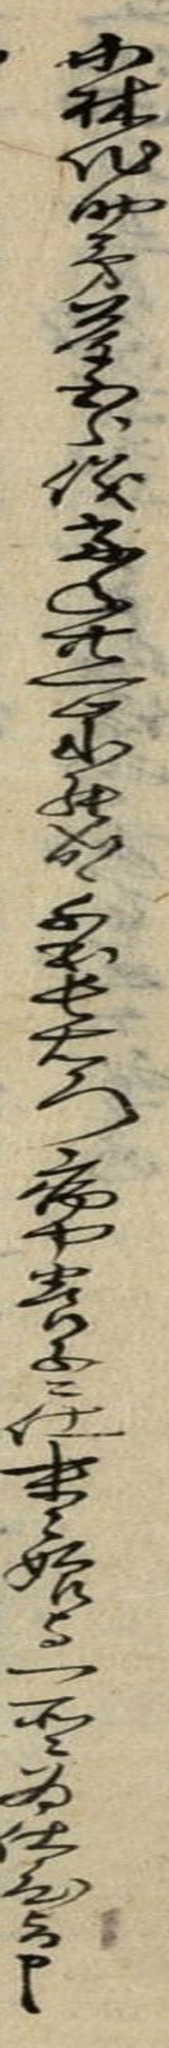小林作助弟藤五郎儀当年廿一歳罷成候千本長右衛門病中養子ニ仕末々娘与一所ニ為仕度旨申
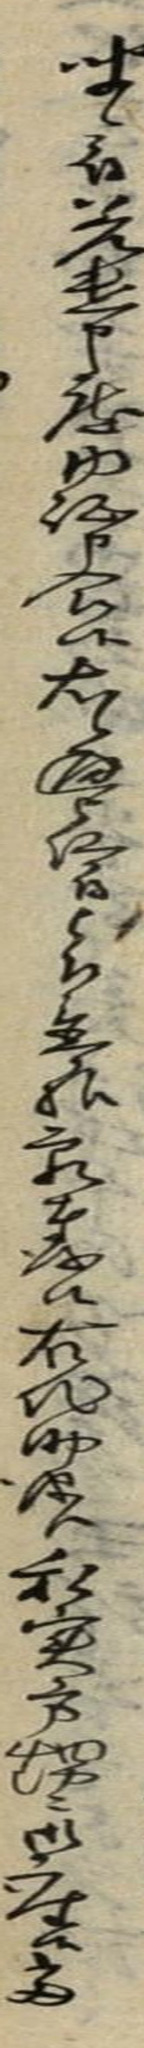聞候ニ付差遣申度内証申合候右之通被仰付被下置候様願奉存候右作助儀ハ私実方甥ニ御座候当
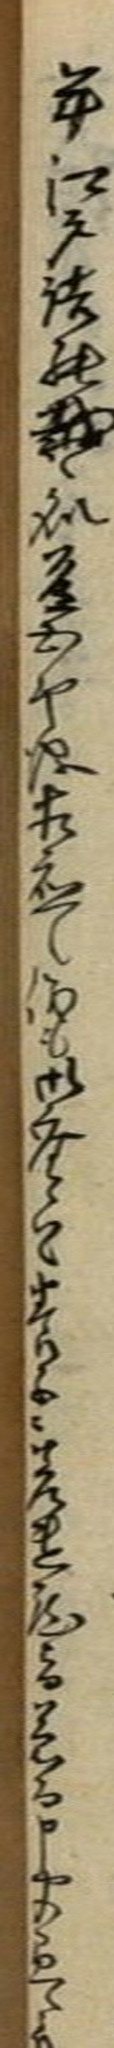年江戸詰罷越候処藤五郎儀相応之儀も御座候ハヽ養子差遣度旨兼而申聞置候ニ付長右衛門
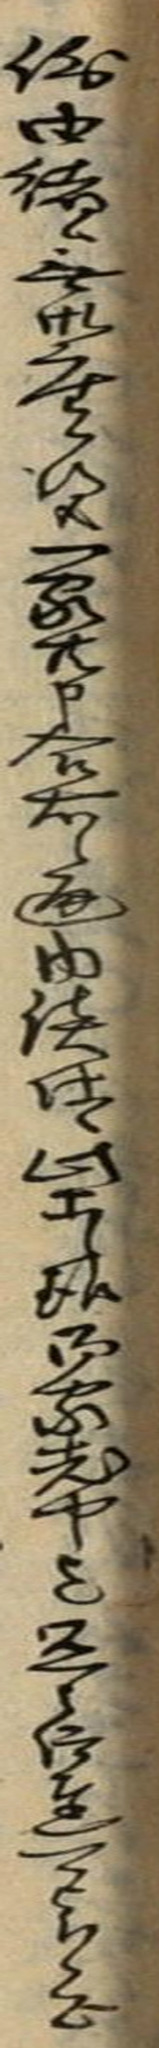儀由緒ハ無御座候得共一家共申合右之通内談仕候此等之趣御家老中迄宜被仰達可被下候已上
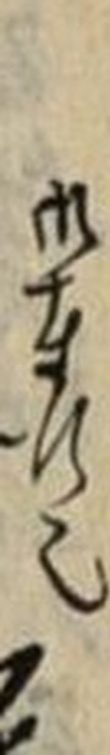御奉行也
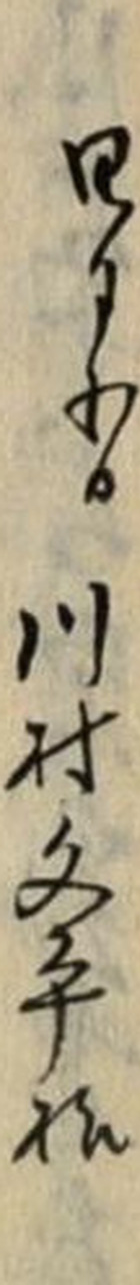四月五日川村文平様
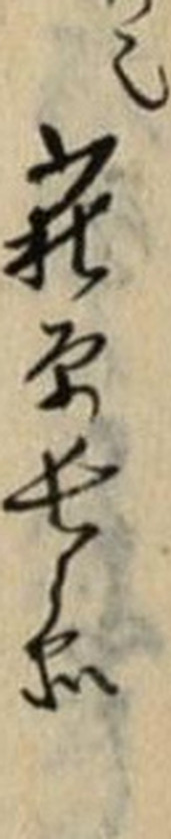萩原長兵衛
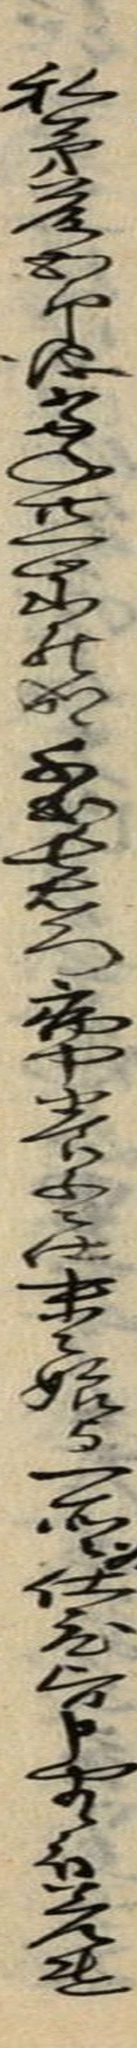私弟藤五郎儀当年廿一歳罷成候千本長右衛門病中養子ニ仕末々娘与一所ニ為仕度旨申聞候ニ付差遣
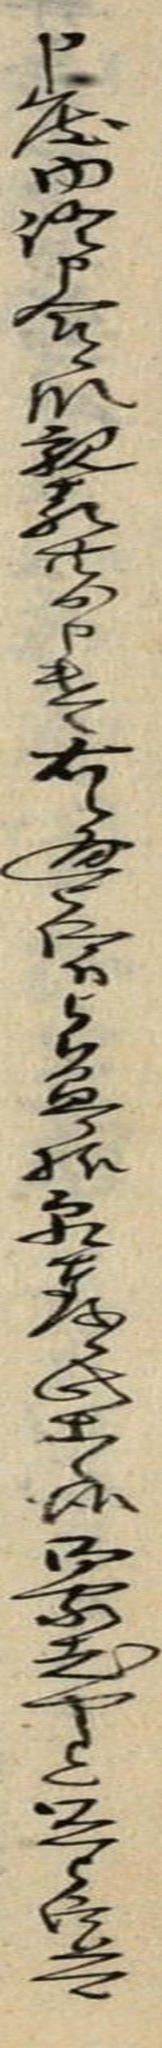申度内談申合候段親類共ゟ申遣候右之通被仰付被下置候様願奉存候此等之趣御家老中迄宜被仰上可
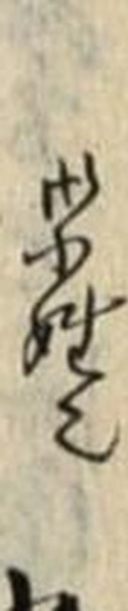御小姓也
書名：養子縁組之部
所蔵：福井県文書館 Fukui Prefectural Archives
